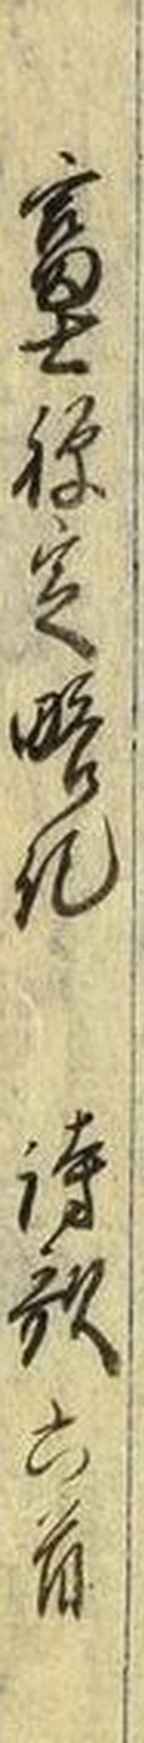富士禅定略記詩歌六首

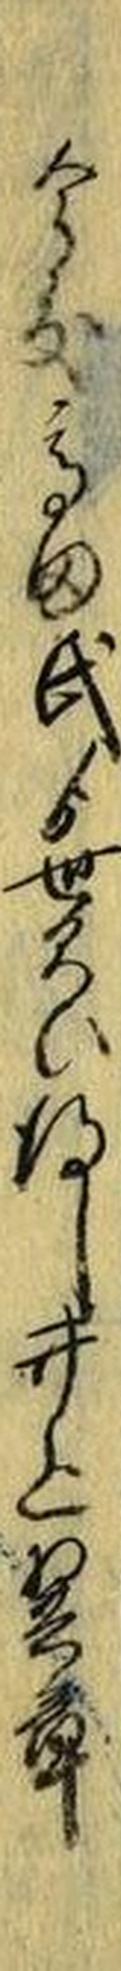今度高田氏ゟ貰ひ得し井上翼章
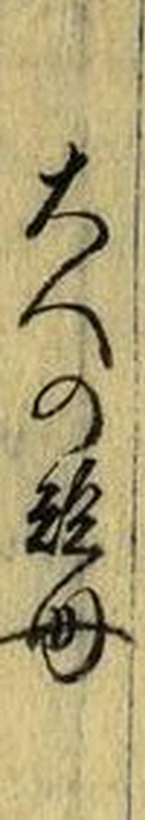大人の短冊
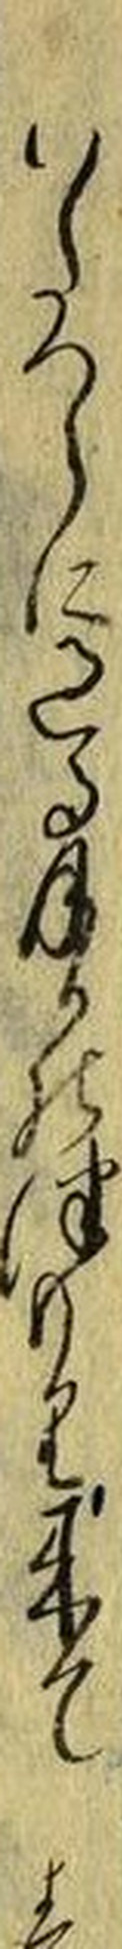いたつらに過る月かのつもり来て素良
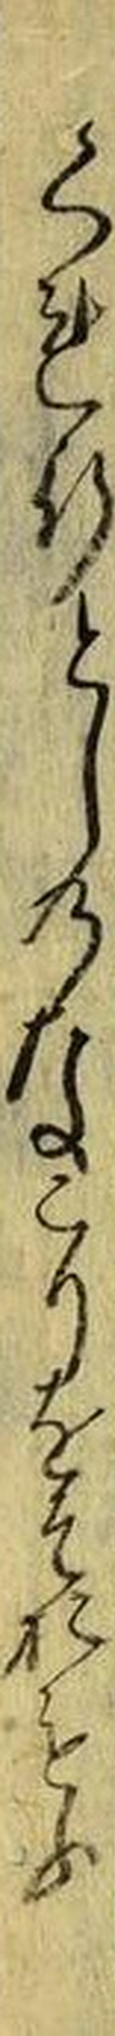くれ行としのなこりをそおもふ
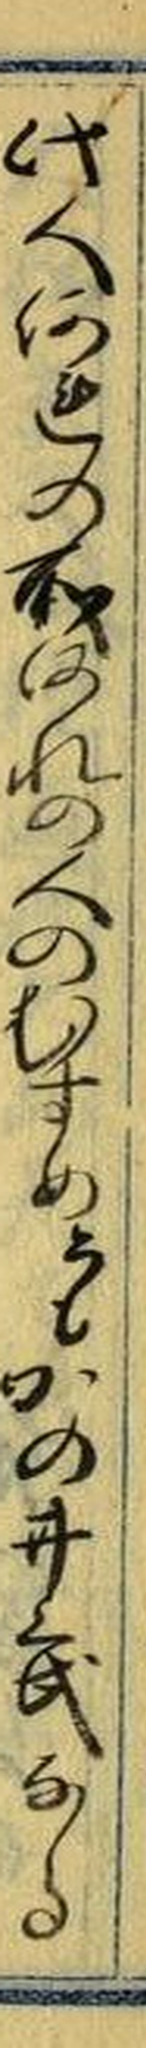此人何れの所何れの人のむすめともかの井上氏なる
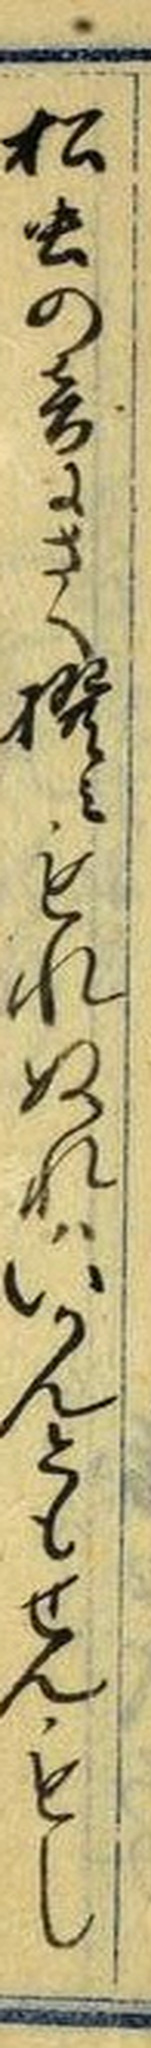松虫の音にさへ撰みもれぬれはいかんともせんもし
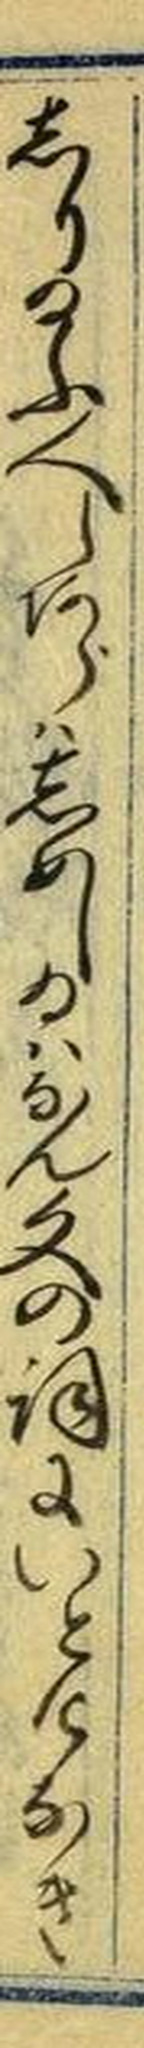しり給ふ人しあらはしめし給はなん文の詞にいとけなき
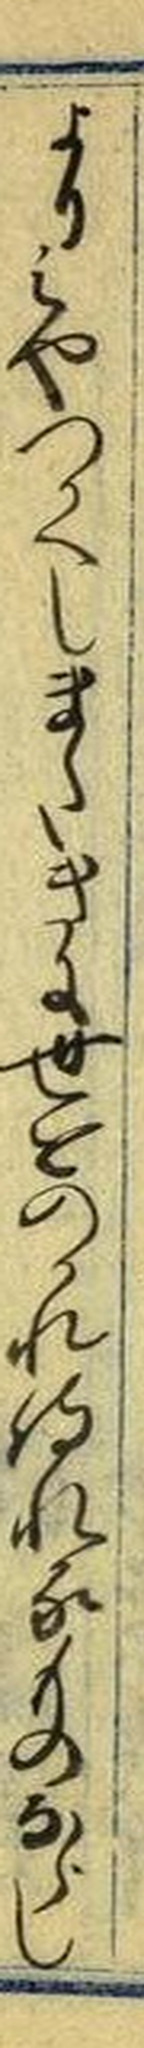よりみやつかへしまたきに世をのかれ侍れるものならし
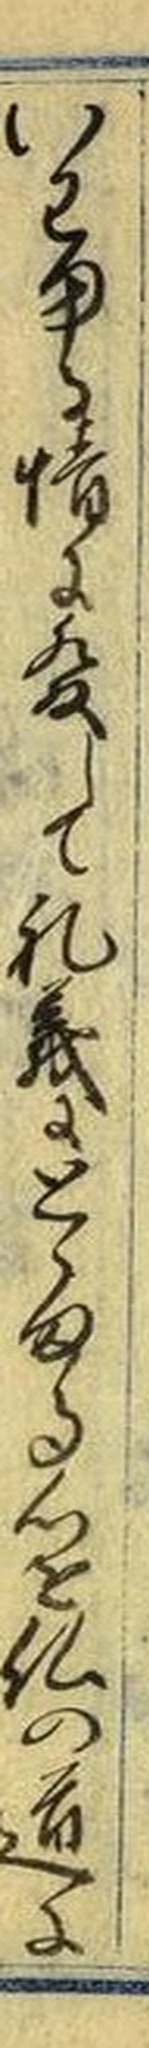いわゆる情に發して礼義にとゝまる心を仏の道に
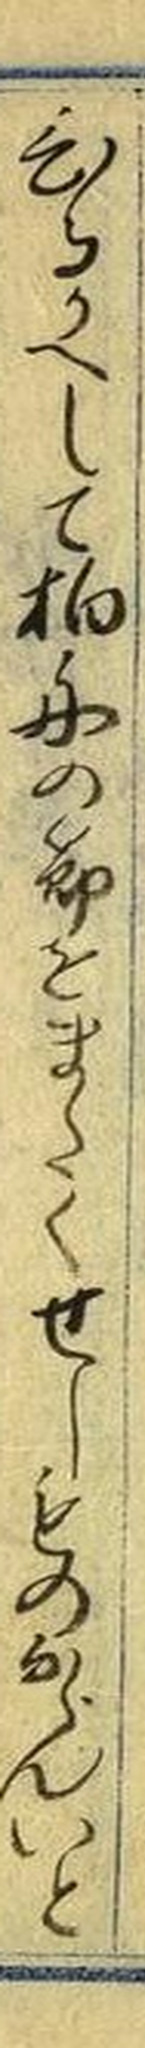ひるかへして柏舟の節をまたくせしものならんいと
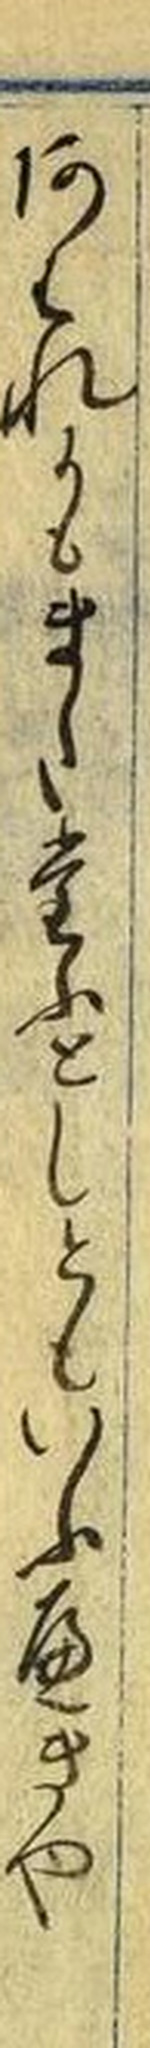あはれにもまたたふとしともいふへきや
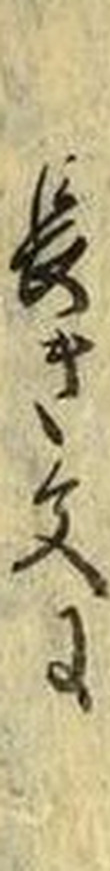長き文に
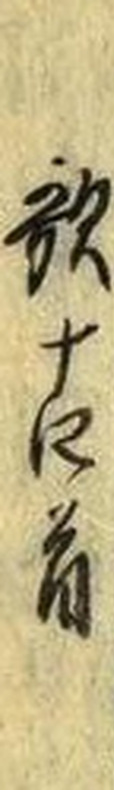歌十四首

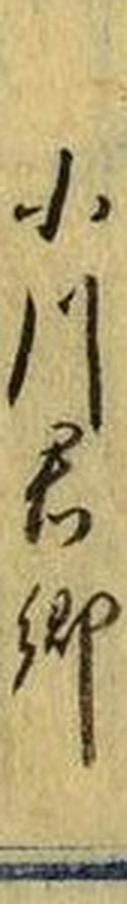小川君郷
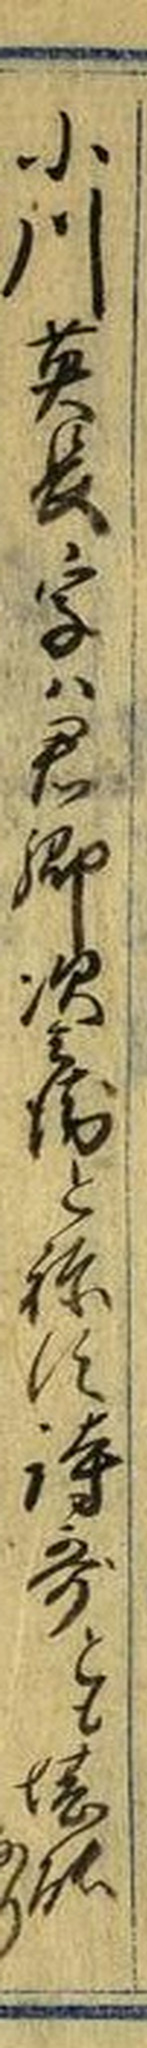小川英長字は君郷次兵衛と称す詩哥とも堪能なり
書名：温古集 三巻
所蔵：福井県文書館 Fukui Prefectural Archives
